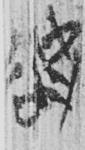欲
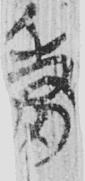殘
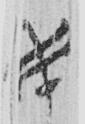民
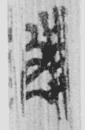○（獵）
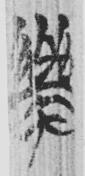樂
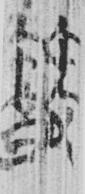○（敦）
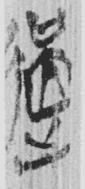○（堪）
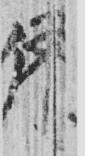伓（背）
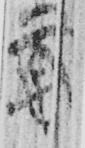○（忨）
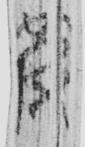皮（疲）
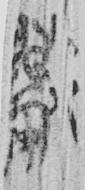○（敝）
